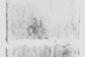十
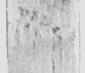九
